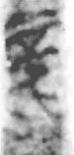麗
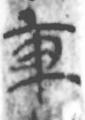車
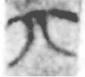亓（其）
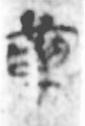革
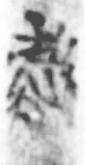○（轡）
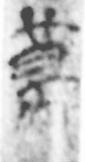黃
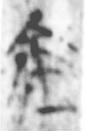金
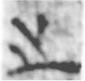之
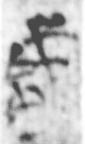釴（飾）
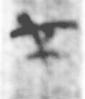才
